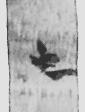十一
